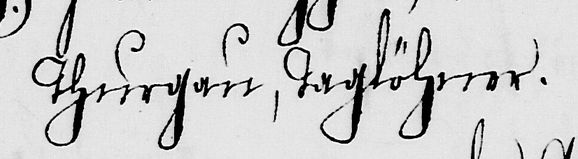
Thurgau, Taglöhner.
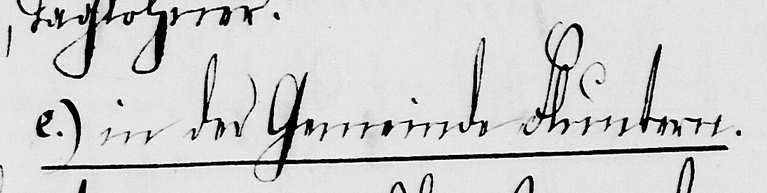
e.) in der Gemeinde Fluntern.
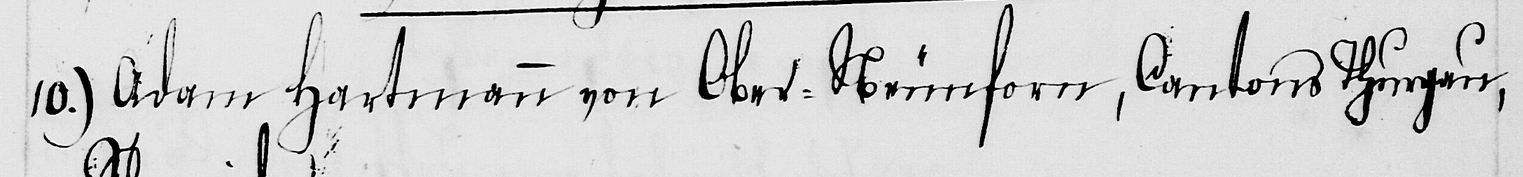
10.) Adam Hartmann von Ober-Neunforn, Cantons Thurgau,
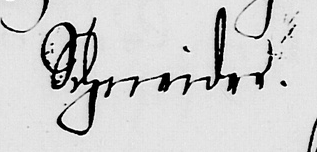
Schneider.
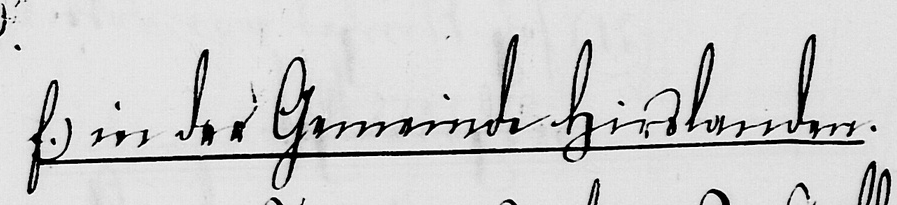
in der Gemeinde Hirslanden.
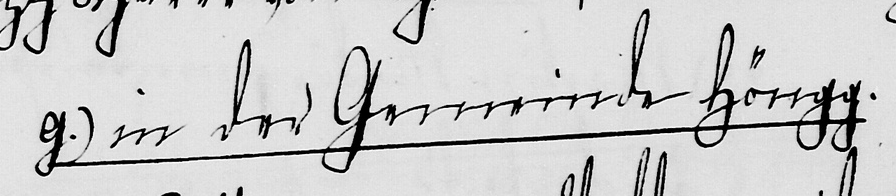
g.) in der Gemeinde Höngg.
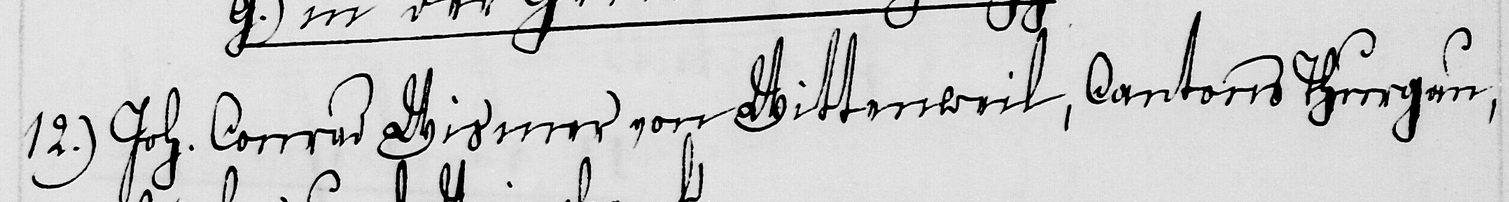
12.) Joh. Conrad Wismer von Wittenweil, Cantons Thurgau,
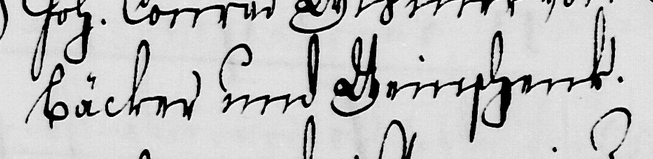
Bäcker und Weinschenk.
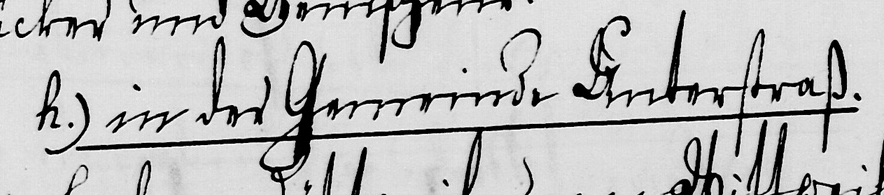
h.) in der Gemeinde Unterstraß.
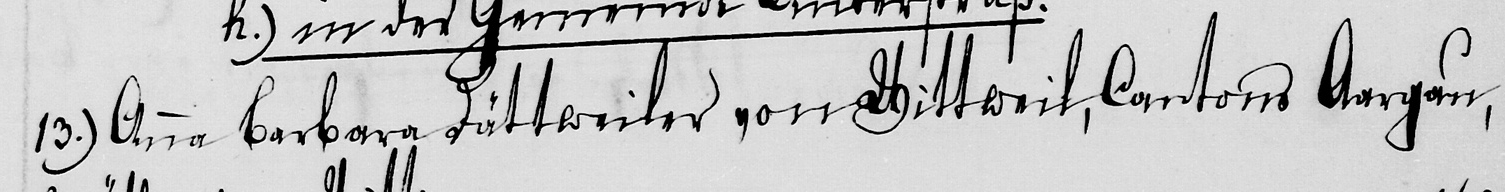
13.) Anna Barbara Dättweiler von Wittweil, Cantons Aargau,
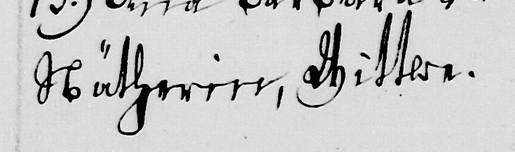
Nätherin, Wittwe.
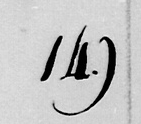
11.)
